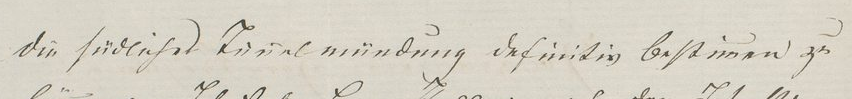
die südliche Tunnelmündung definitiv bestimmen zu
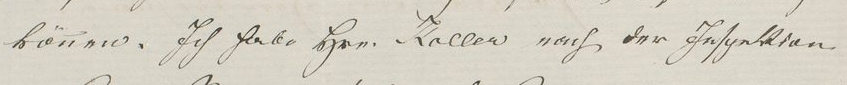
können. Ich habe Hrn. Koller nach der Inspektion
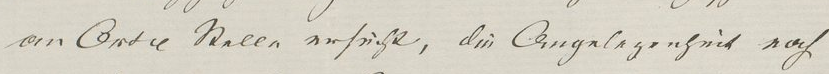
an Ort & Stelle ersucht, die Angelegenheit noch
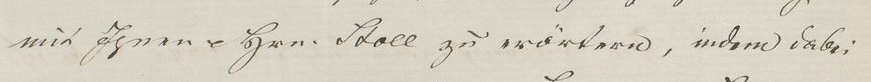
mit Ihnen & Hrn. Stoll zu erörtern, indem dabei
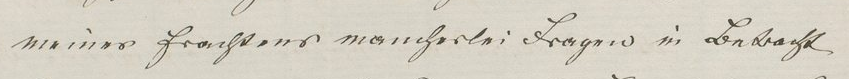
meines Erachtens mancherlei Fragen in Betracht
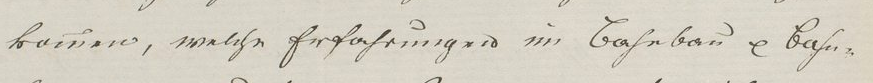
kommen, welche Erfahrungen im Bahnbau & Bahn-
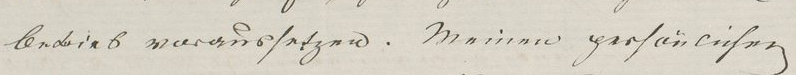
betrieb voraussetzen. Meinen persönlichen
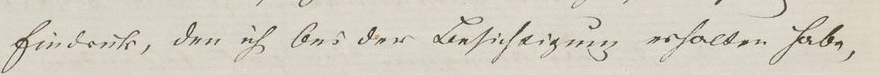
Eindruk, den ich bei der Besichtigung erhalten habe,
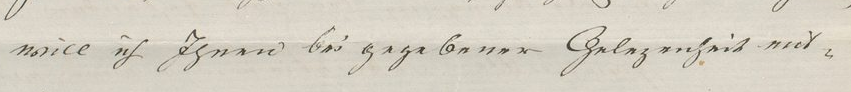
will ich Ihnen bei gegebener Gelegenheit mit-
